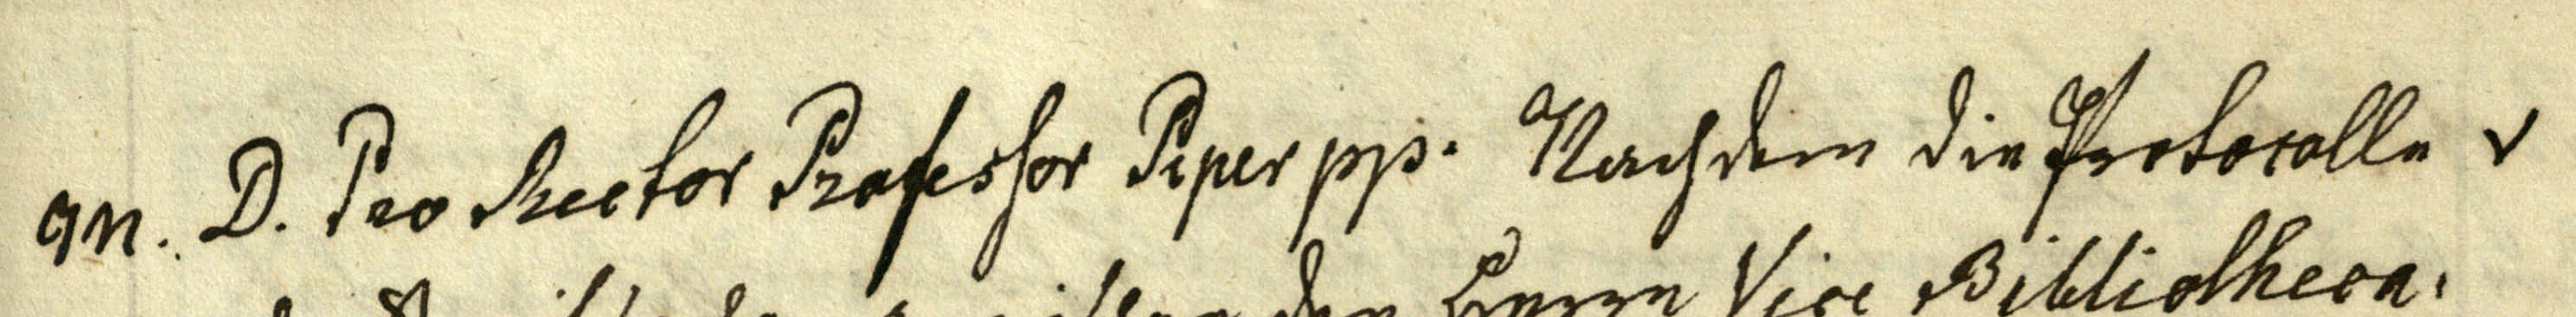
M. D. Pro Rector Professor Piper pp. Nachdem die Protocolle
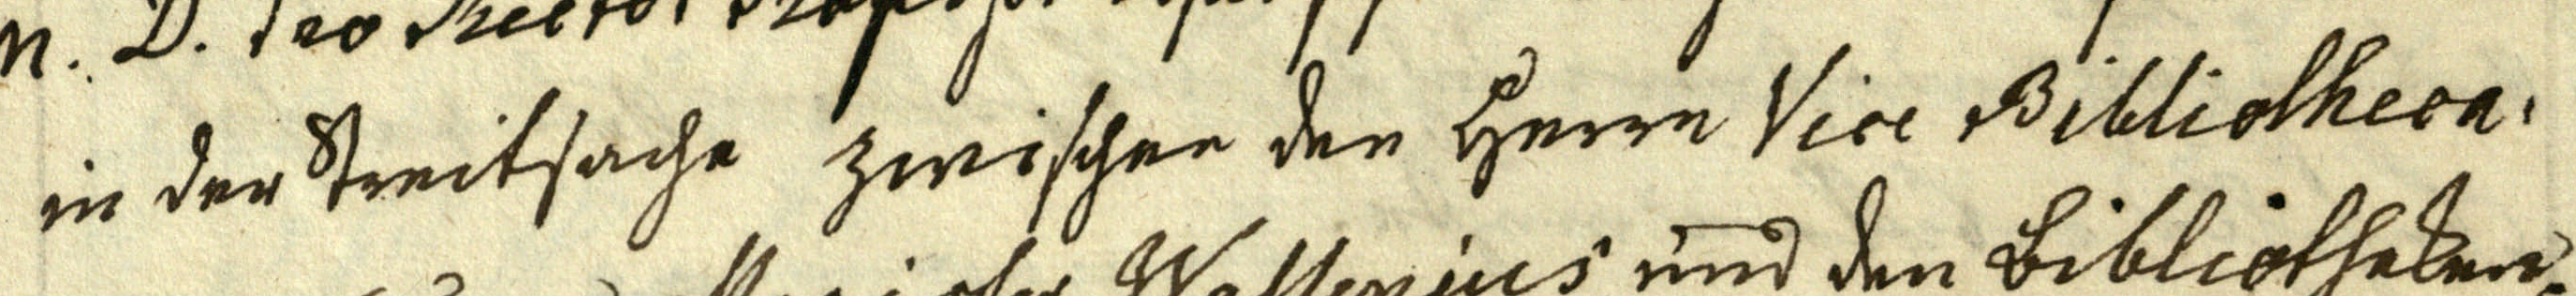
in der Streitsache zwischen den Herrn Vice Bibliotheca¬
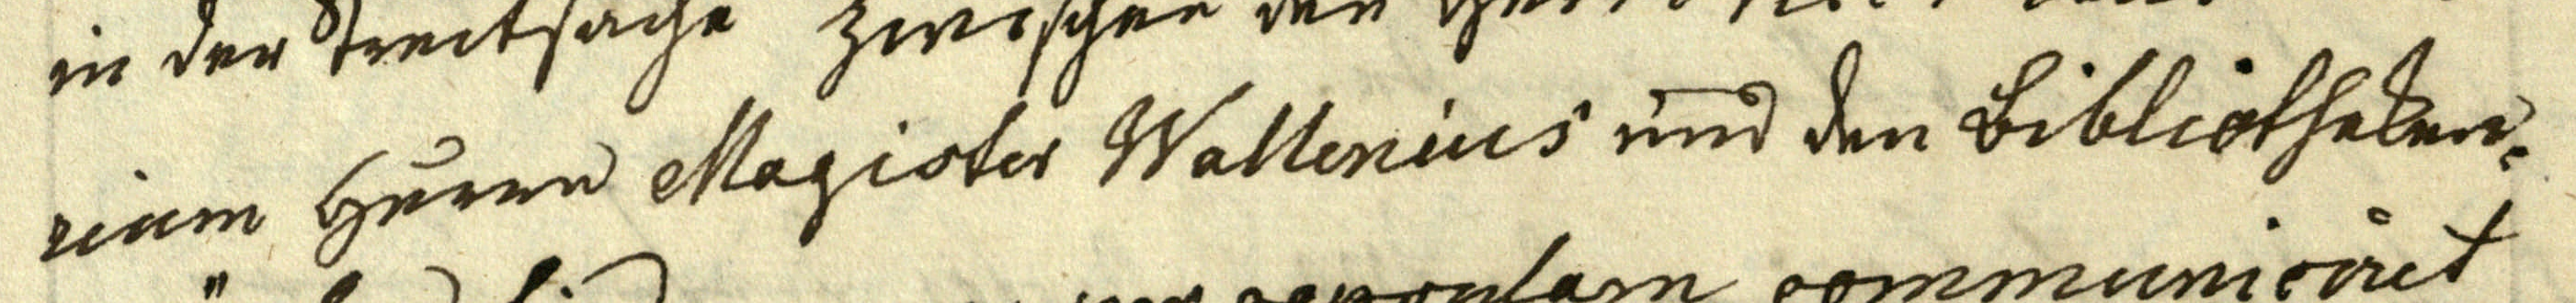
rium Herrn Magister Wallenius und dem Bibliotheken¬
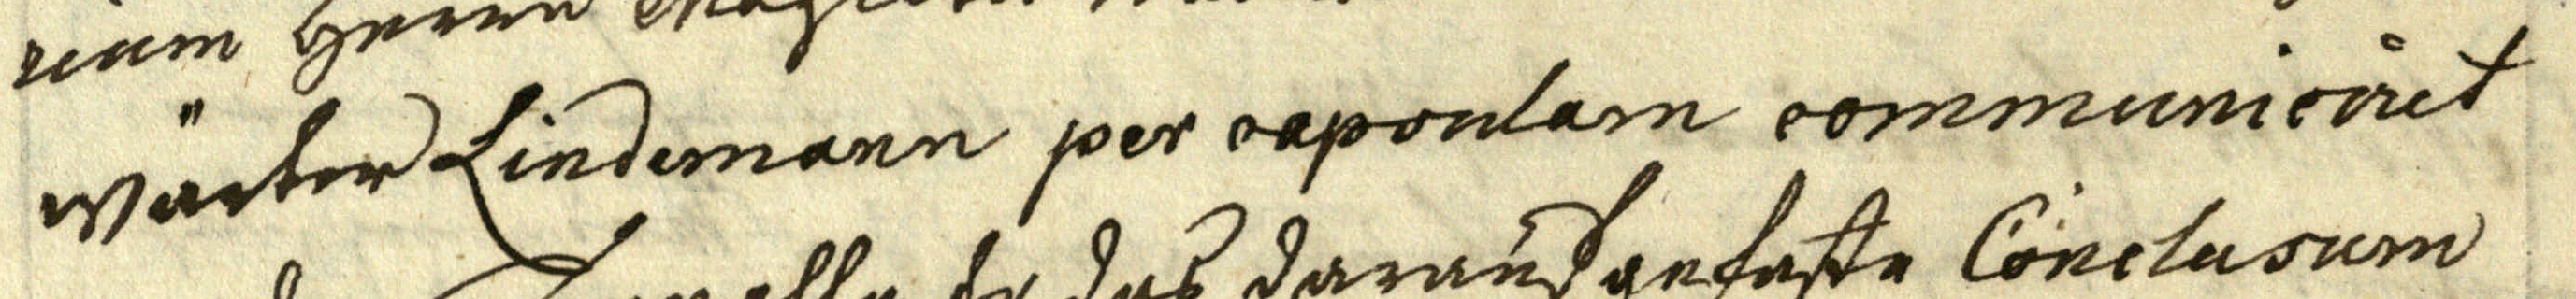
wärter Lindemann per capsulam communiciret
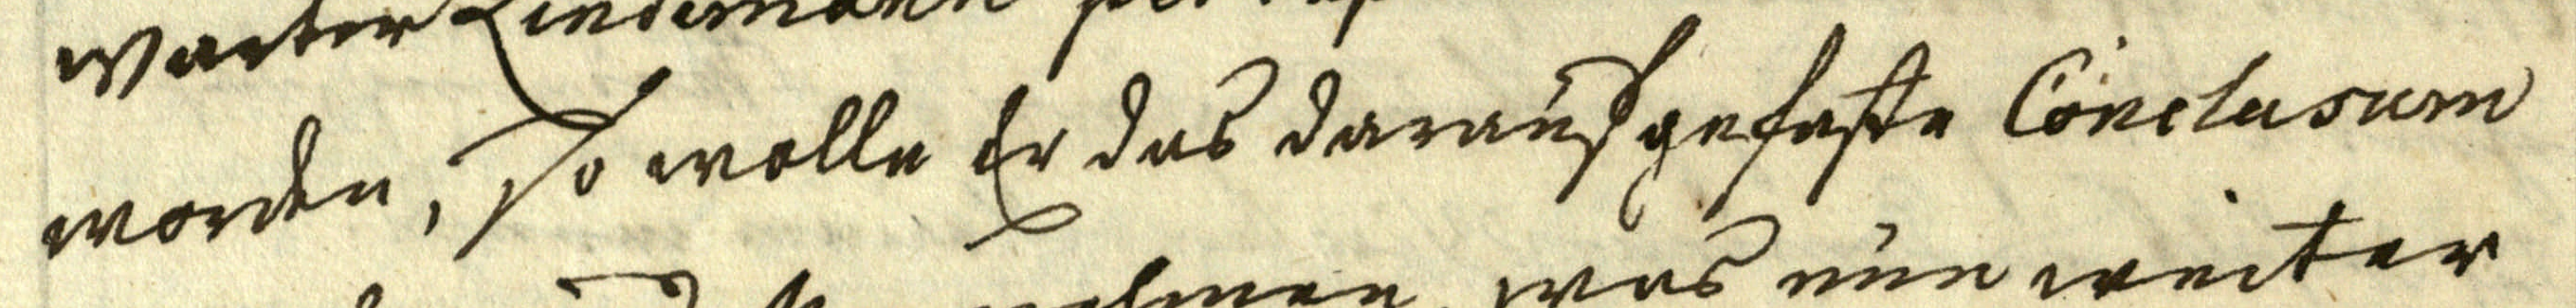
worden, so wolle Er das darauf gefaste Conclusum
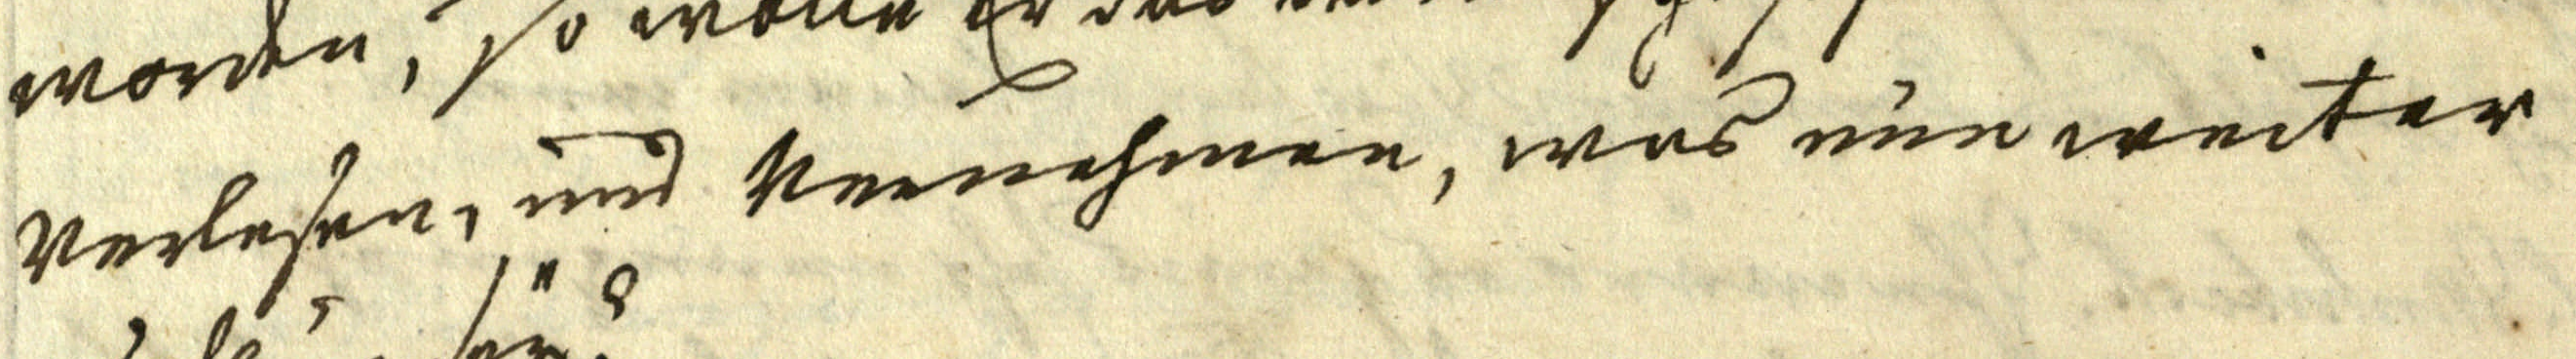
verlesen, und vernehmen, was nun weiter
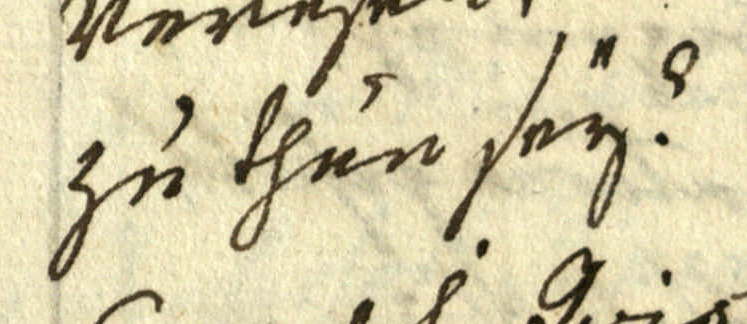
zu thun seÿ?
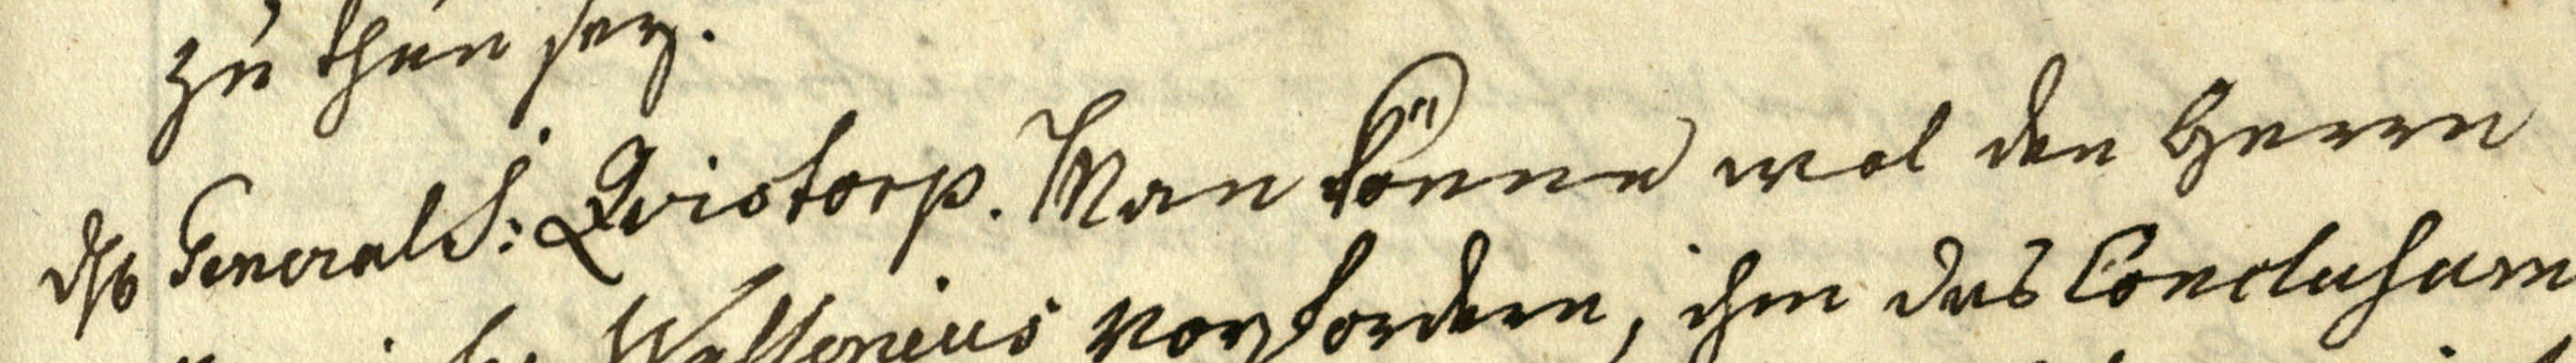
dh GeneralS. Quistorp. Man könne wol den Herrn
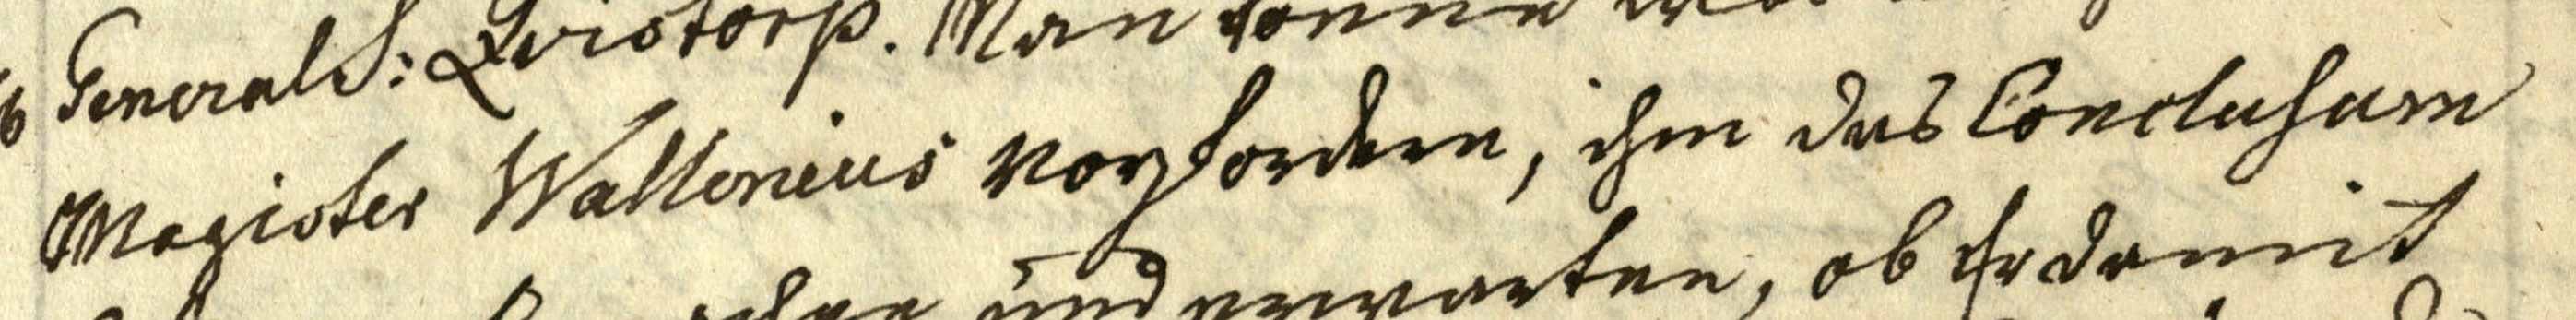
Magister Wallenius vorfordern, ihm das Conclusum
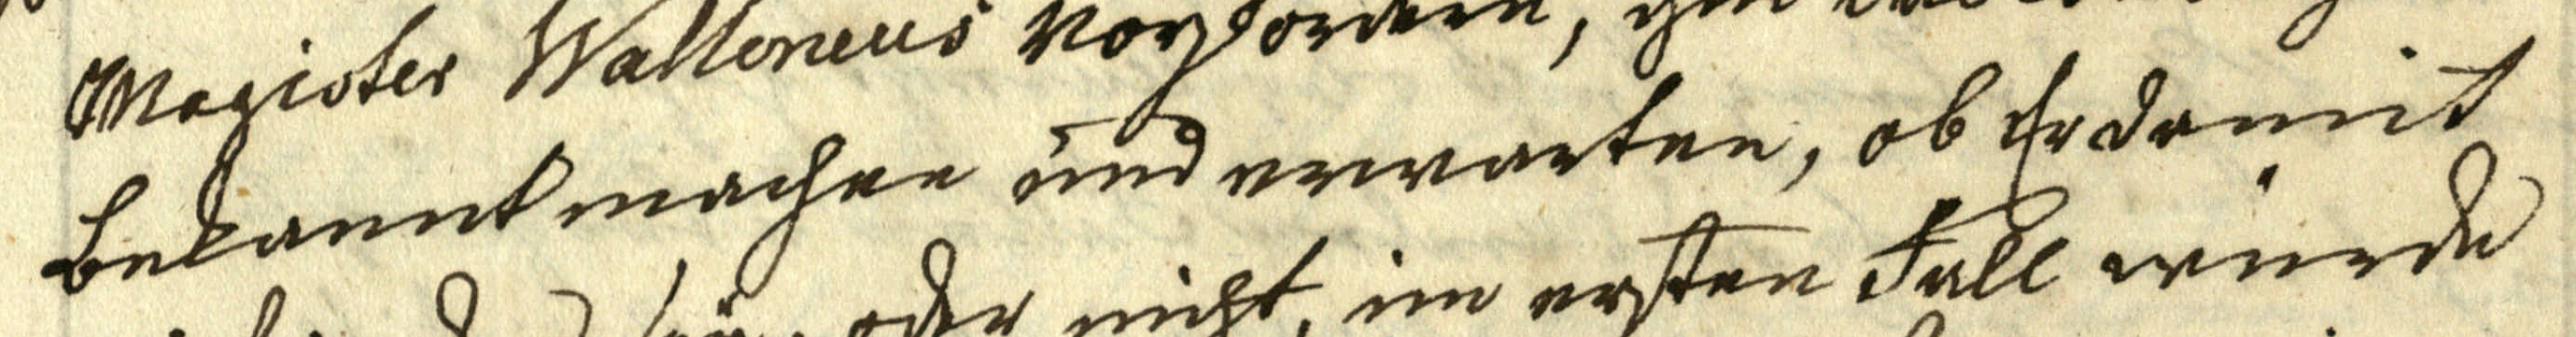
bekannt machen und erwarten, ob Er damit
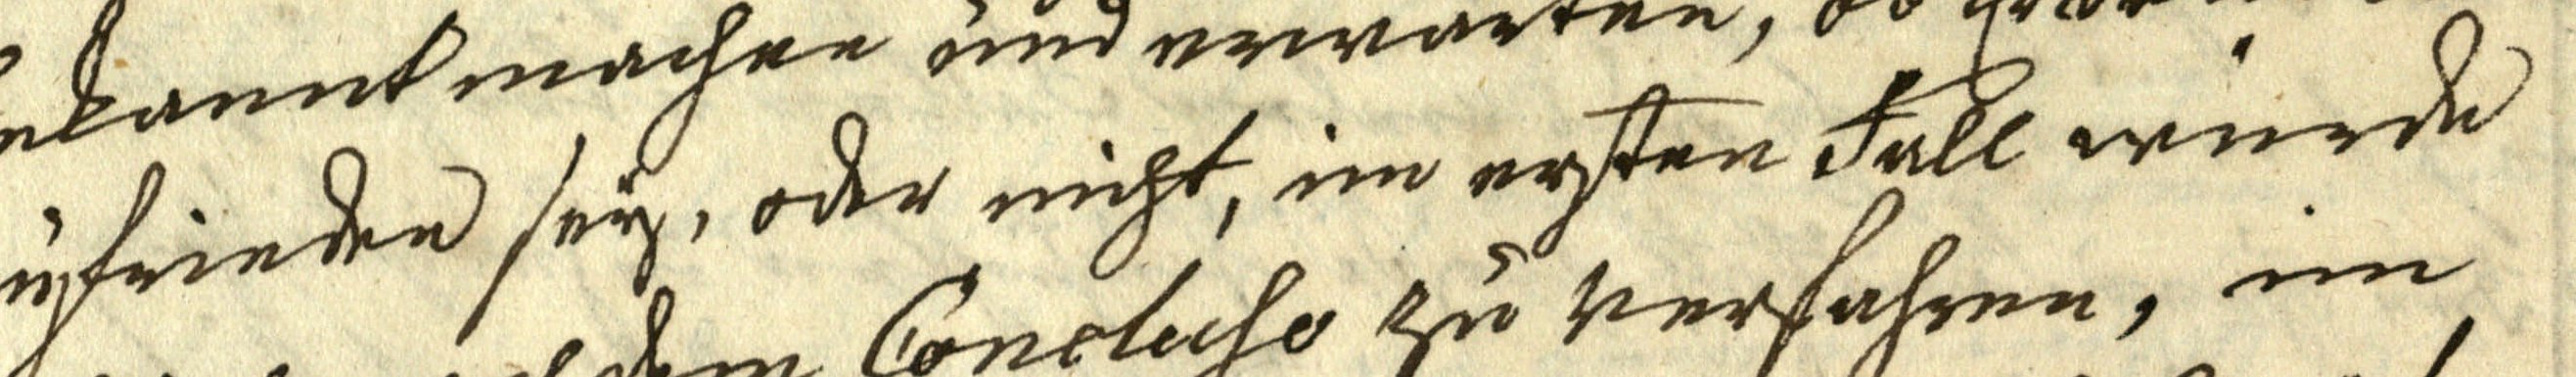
zufrieden seÿ, oder nicht, im ersten Fall würde
